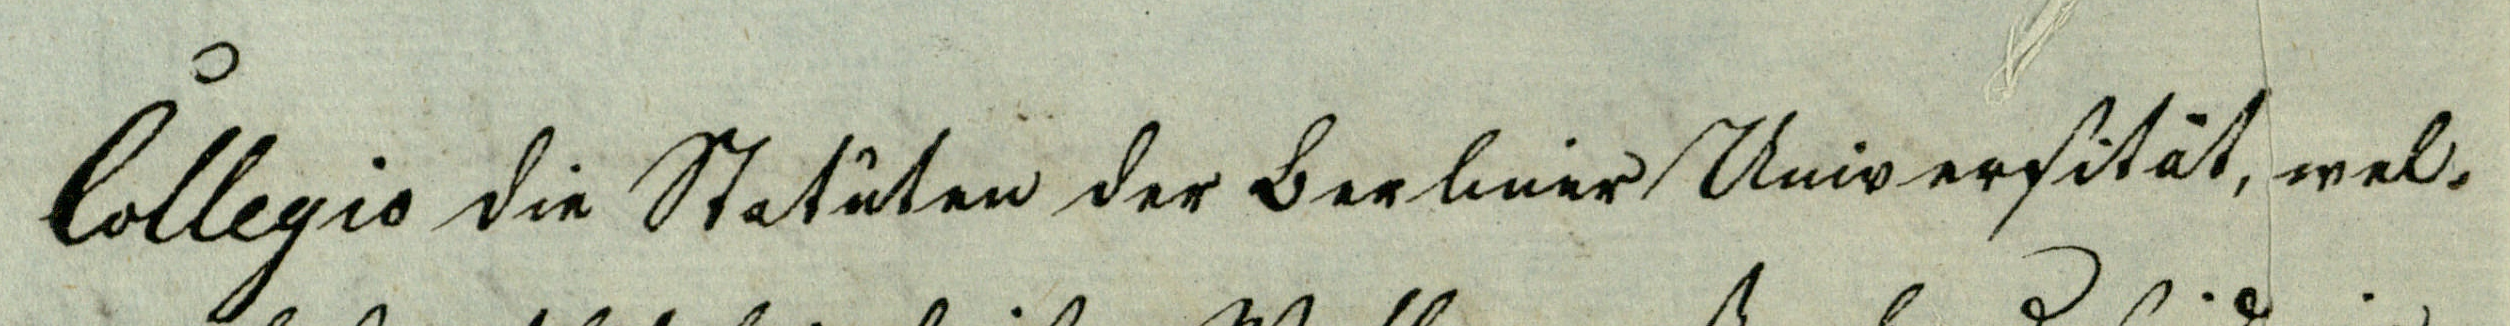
Collegio die Statuten der Berliner Universität, wel¬
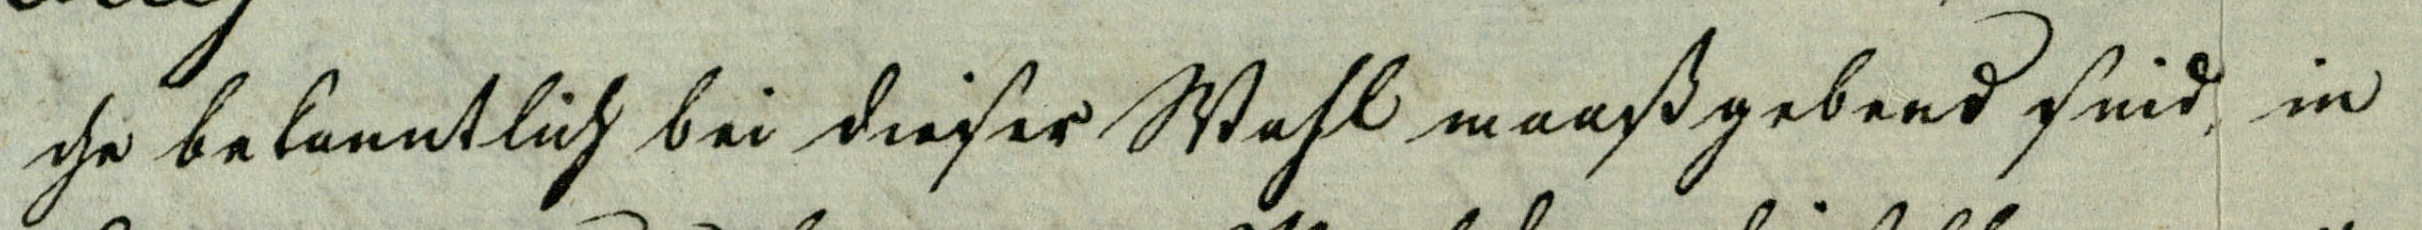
che bekanntlich bei dieser Wahl maaßgebend sind, in
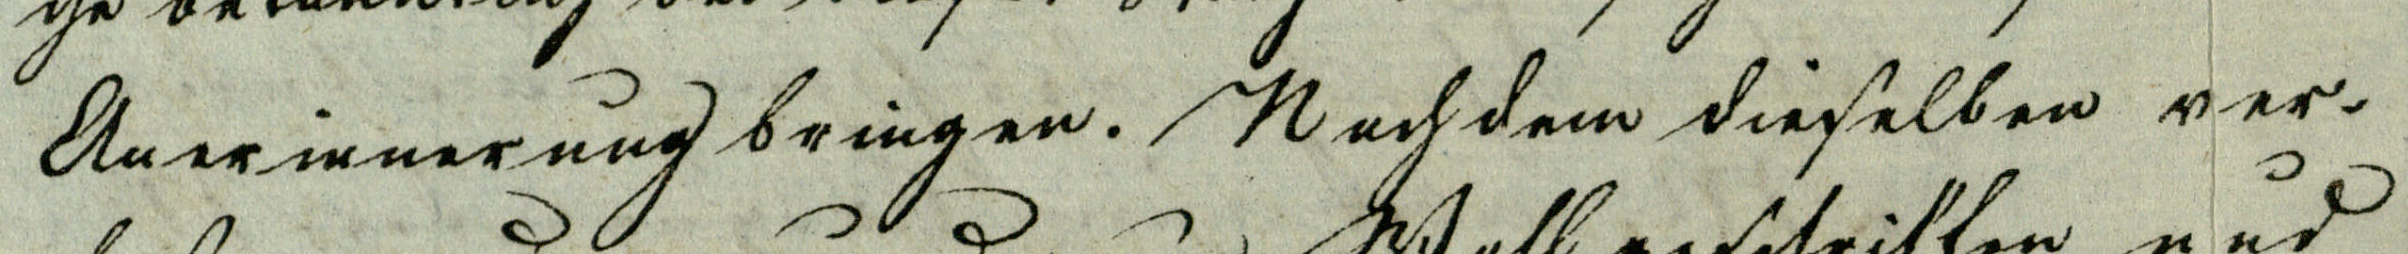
Anerinnerung bringen. Nachdem dieselben ver¬
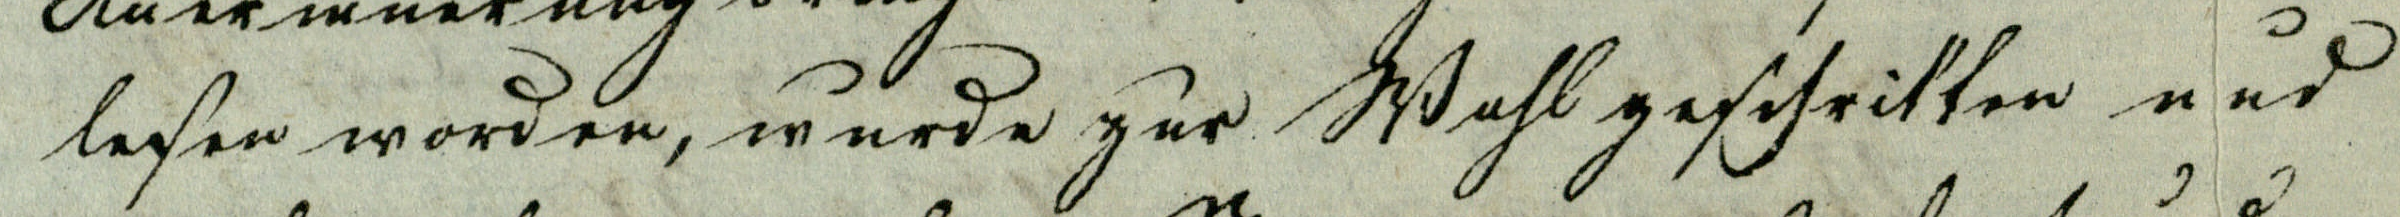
lesen worden, wurde zur Wahl geschritten und
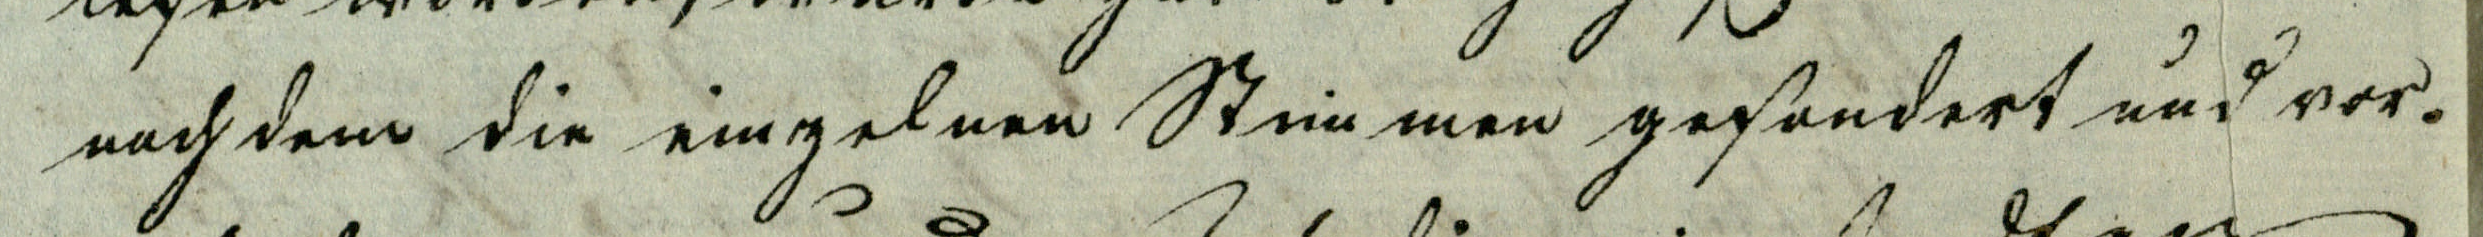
nachdem die einzelnen Stimmen gesondert und vor¬
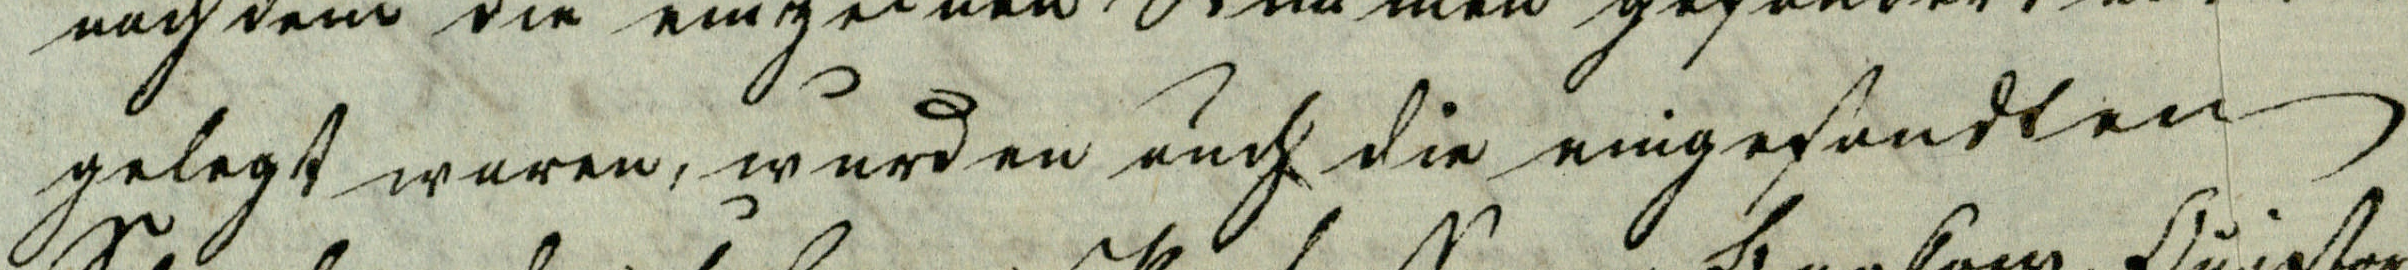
gelegt waren, wurden auch die eingesandten
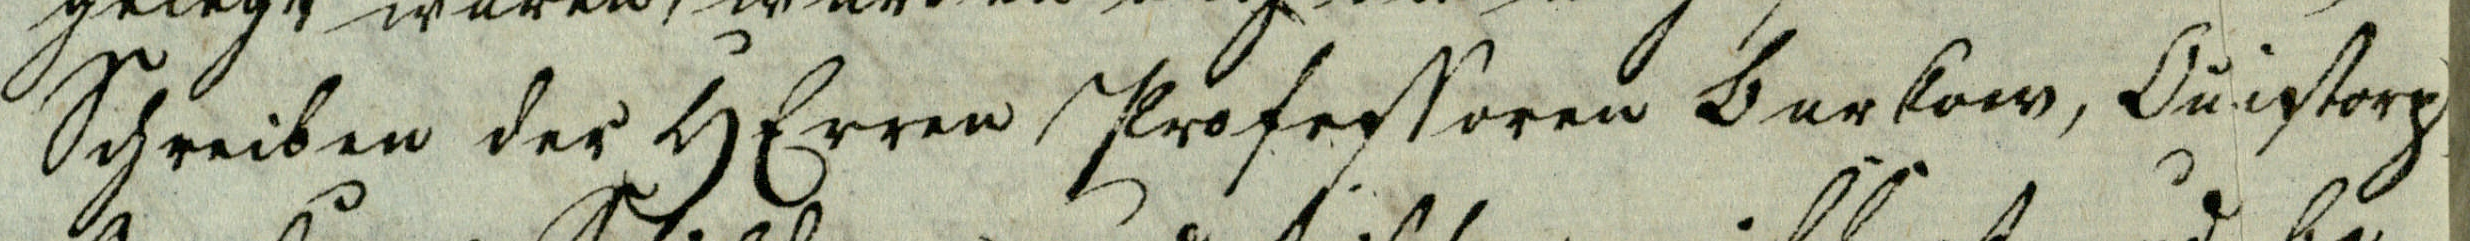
Schreiben der HErren Professoren Barkow, Quistorp
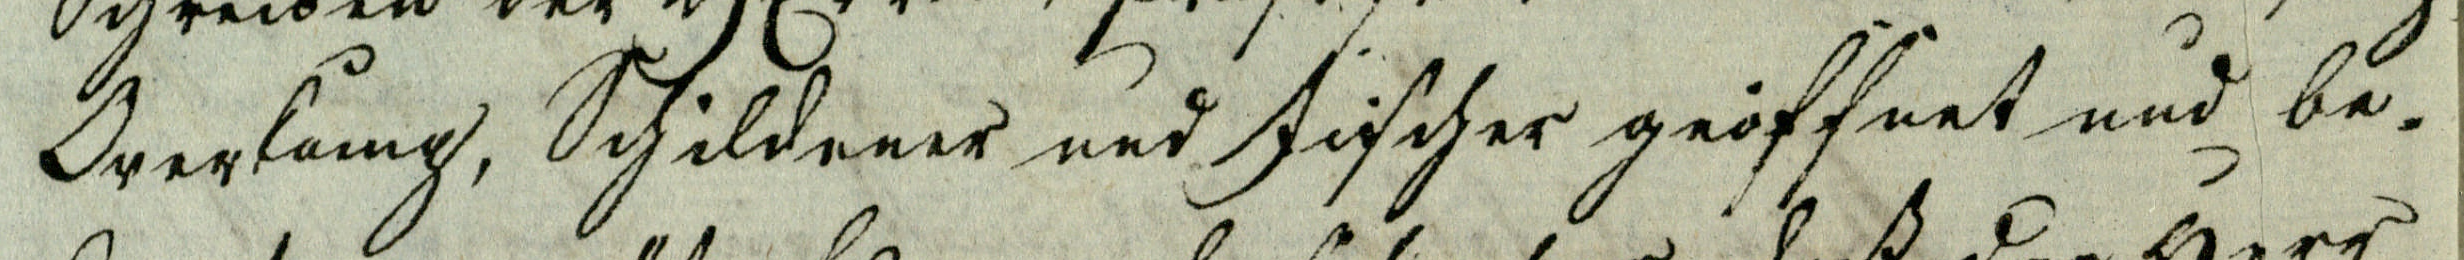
Overkamp, Schildener und Fischer geöffnet und be¬
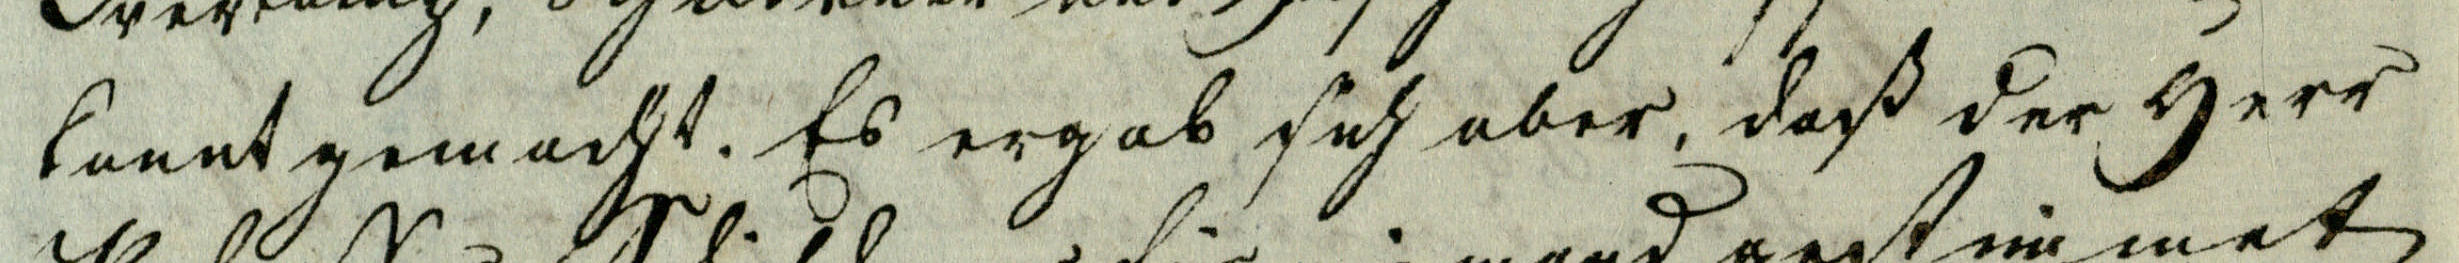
kannt gemacht.Es ergab sich aber, daß der Herr
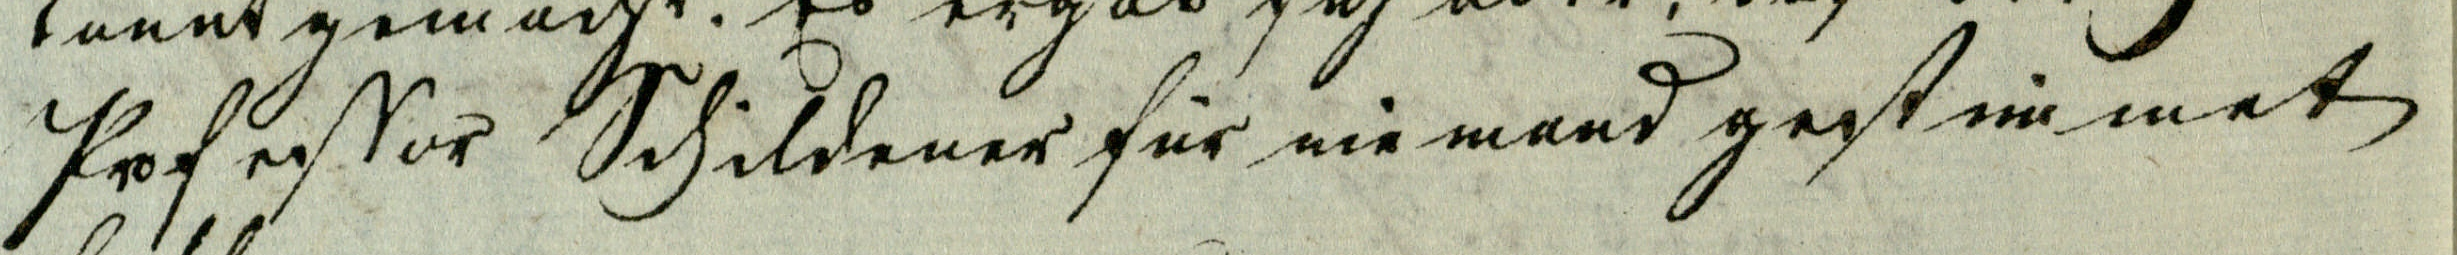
Professor Schildener für niemand gestimmt
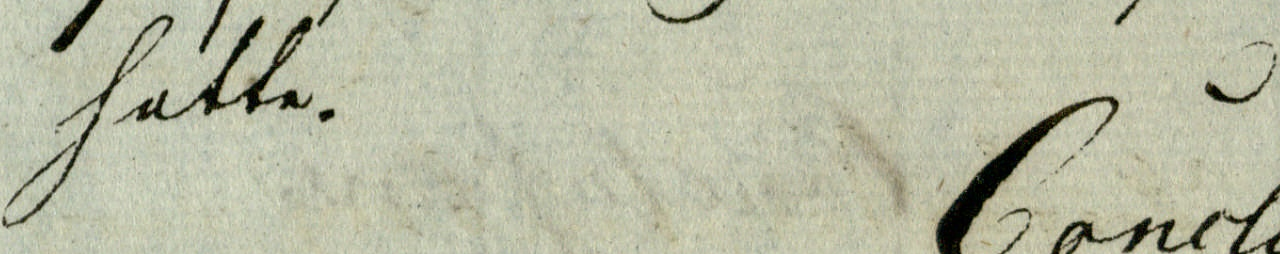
hatte.
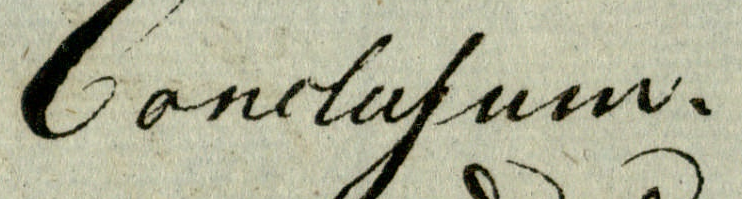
Conclusum:
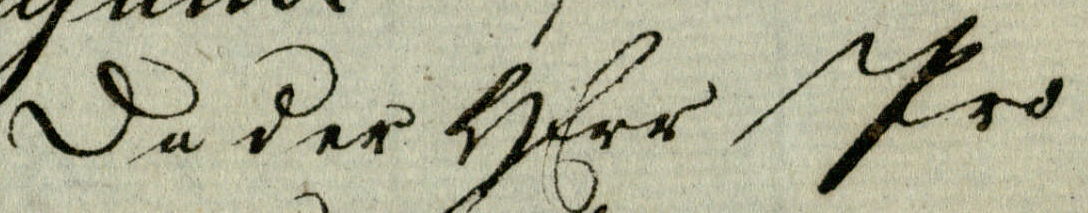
Da der HErr Pro¬
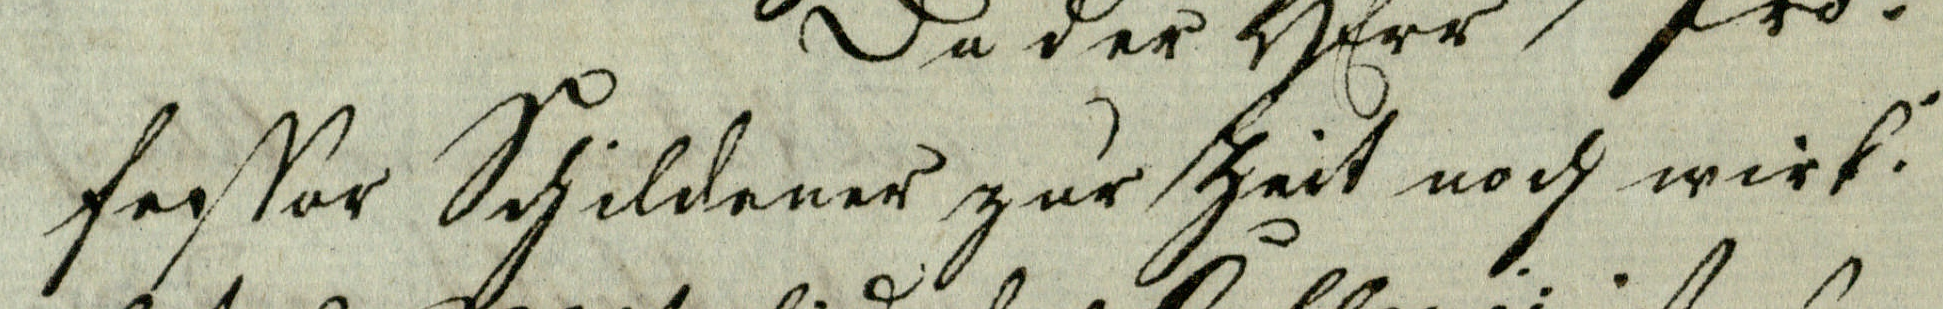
fessor Schildener zur Zeit noch wirk¬
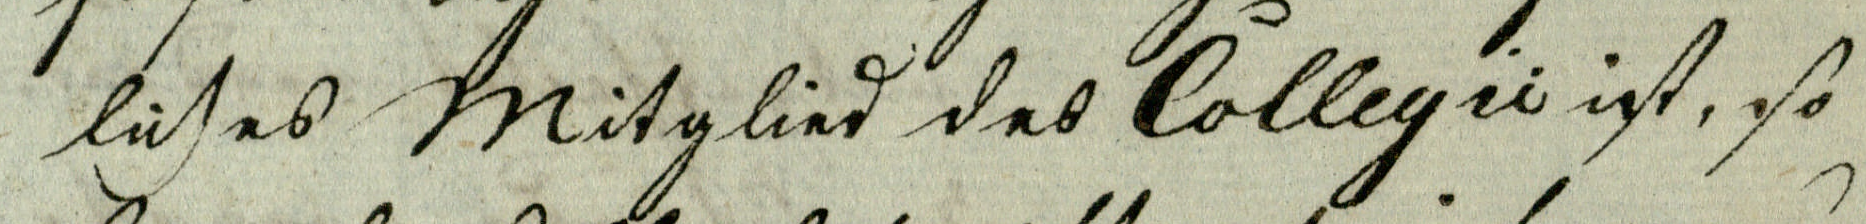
liches Mitglied des Collegii ist, so
